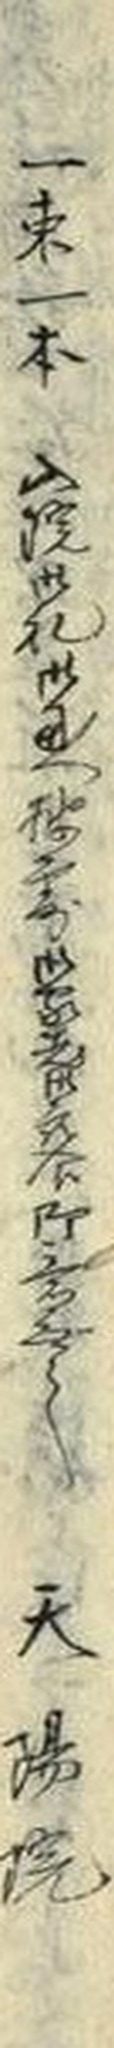一束一本入院御礼御用人披露御家老御取合御意無之天陽院

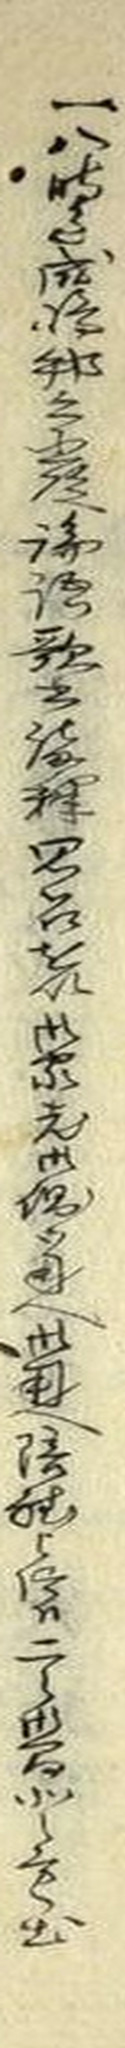一八時過成嶋邦之丞殿論語歌書講釈思召を以御家老御側御用人御用人陪聴被仰付二之御間北之方へ出
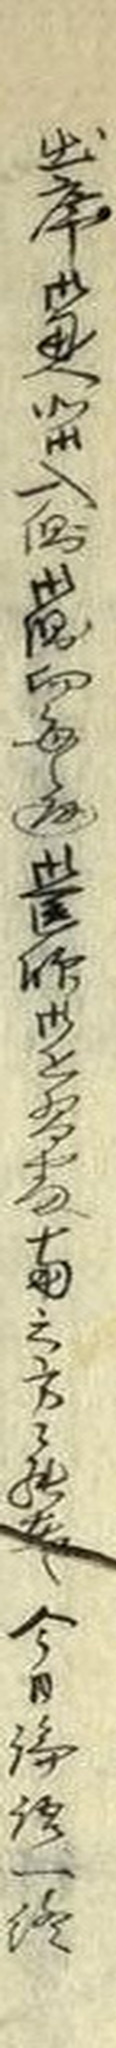出席御用人北御入側御側向毎之通御医師御近習番南之方ニ罷在候今日論語一終
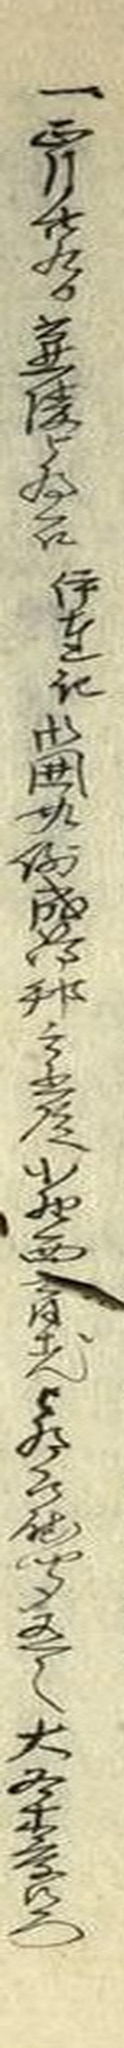一正月廿九日燕凌被為召伊達記御囲如例成嶋邦之丞殿小野西育老被為召聴聞有之大谷木藤左衛門
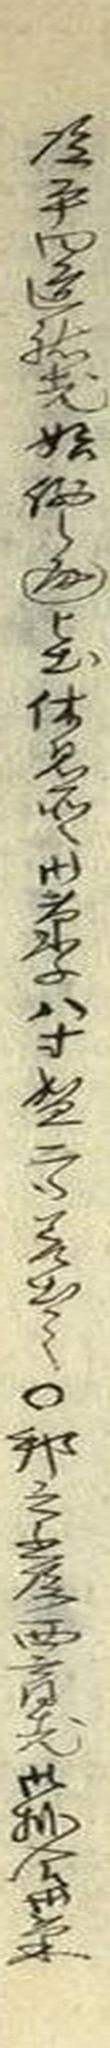殿平田道祐老始例之通被出休息所へ御菓子八寸盛二ツ差出之〇邦之丞殿西育老御掛合御菓
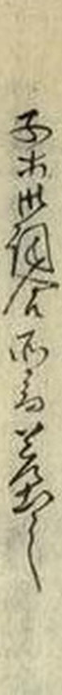子等御調合所ニ而差出之
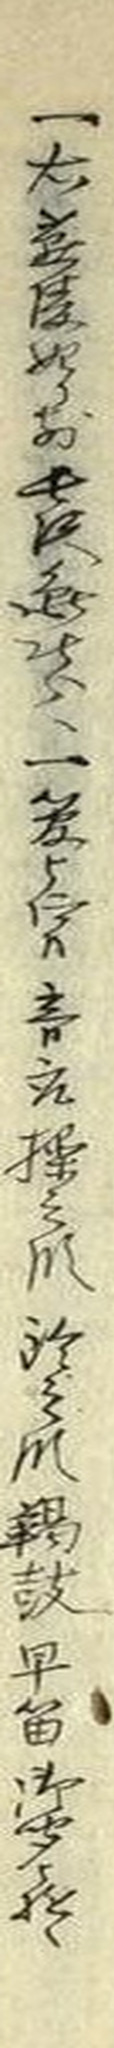一右燕凌始り前長沢亀次郎へ一管被仰付音取揉之段鈴之段鞨鼓早笛御聞被遊候
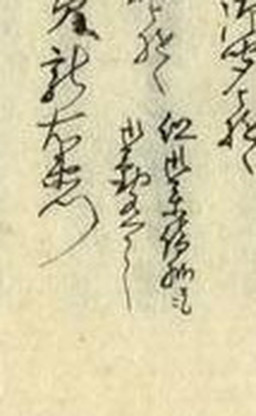御勤有之
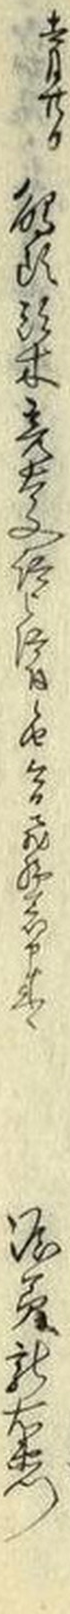去月廿日触頭鈴木彦太夫跡被仰付候由今日飛脚着申来候渥美新右衛門
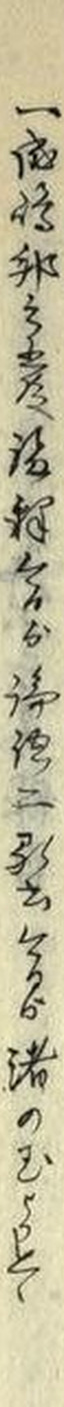一成嶋邦之丞殿講釈今日ゟ論語二歌書今日ゟ渚の玉被申上候
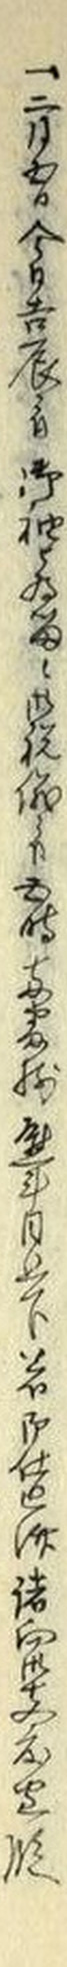一二月五日今日吉辰ニ付御袖被為留候御祝儀ニ付五時両番揃熨斗目上下着御仕廻済諸向御支度宜段
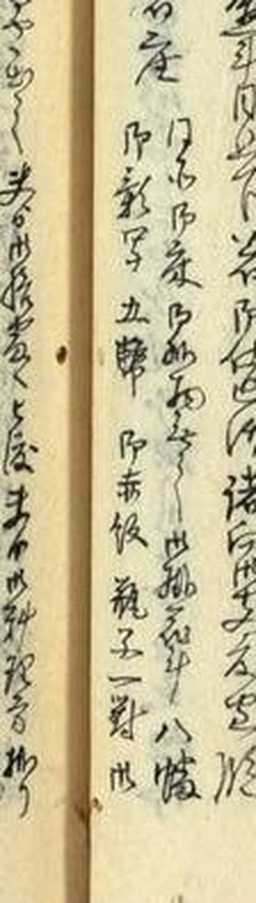御影写五幣御赤飯瓶子一対御
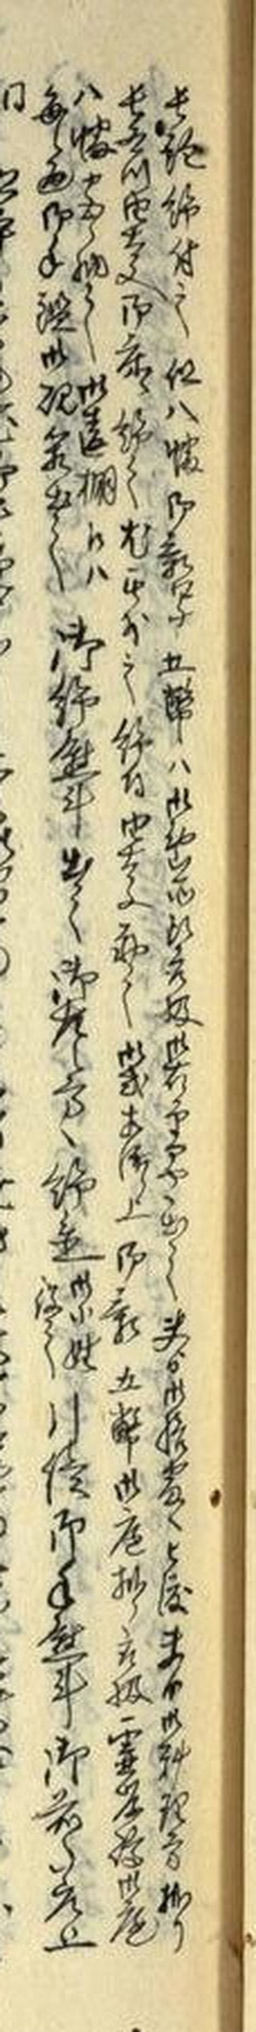長谷川由太夫御床へ飾之尤其外之飾付由太夫勤之御式相済候上御彰五幣御庭掛り取扱霊岸島御庭
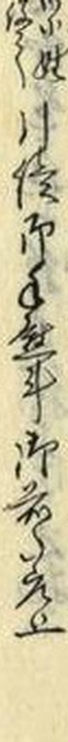役之引続御手熨斗御前へ差上
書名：少傅日録抄（斉善付側向頭取日記、在府）
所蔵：福井県文書館 Fukui Prefectural Archives
